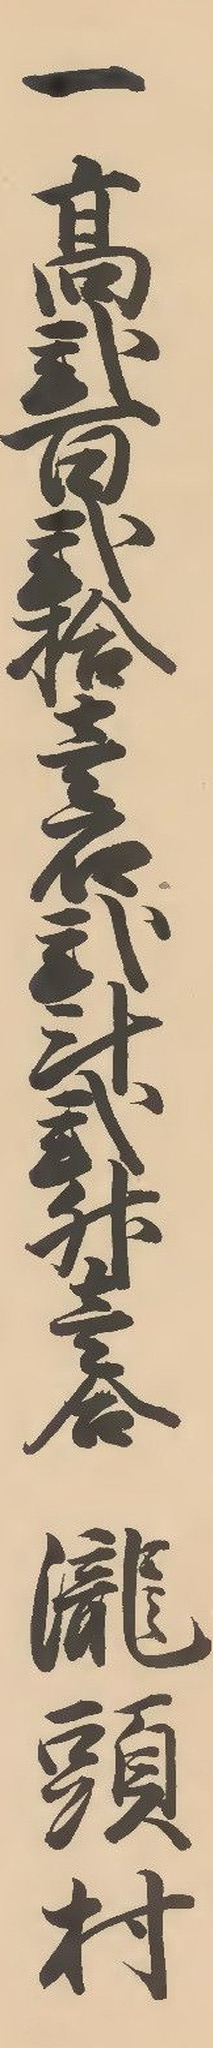一高弐百弐拾壱石弐斗弐升壱合瀧頭村
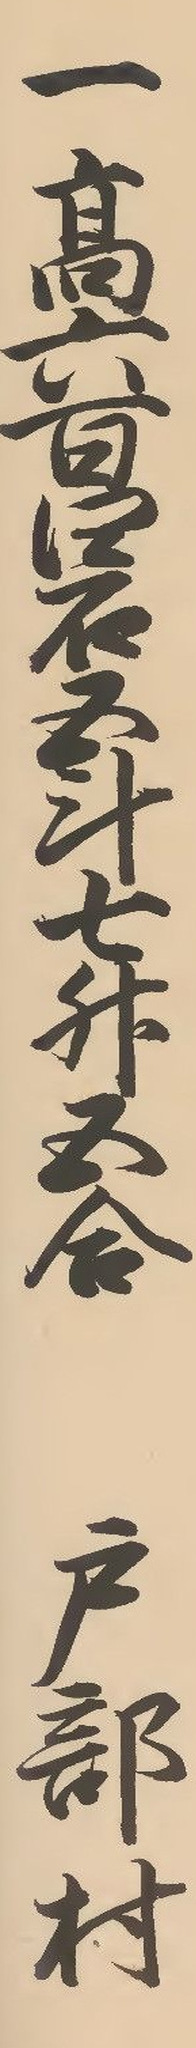一高六百四石五斗七升五合戸部村
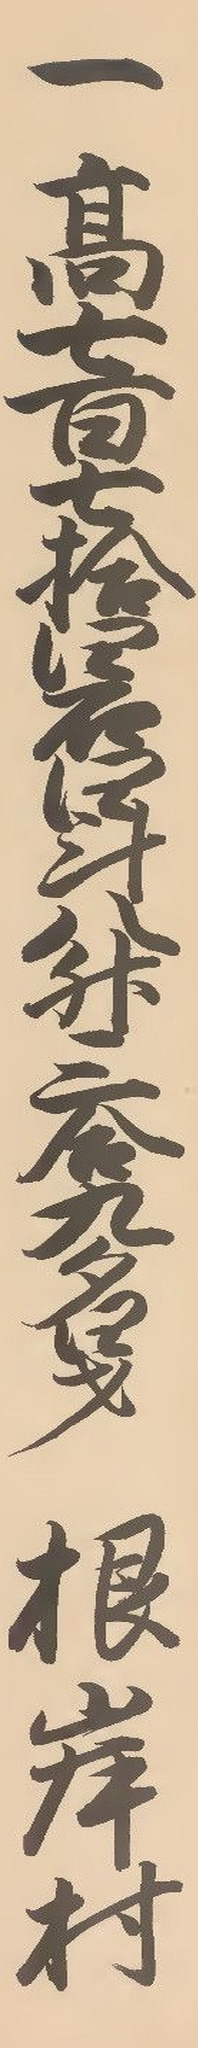一高七百七拾四石四斗八升三合九勺四才根岸村
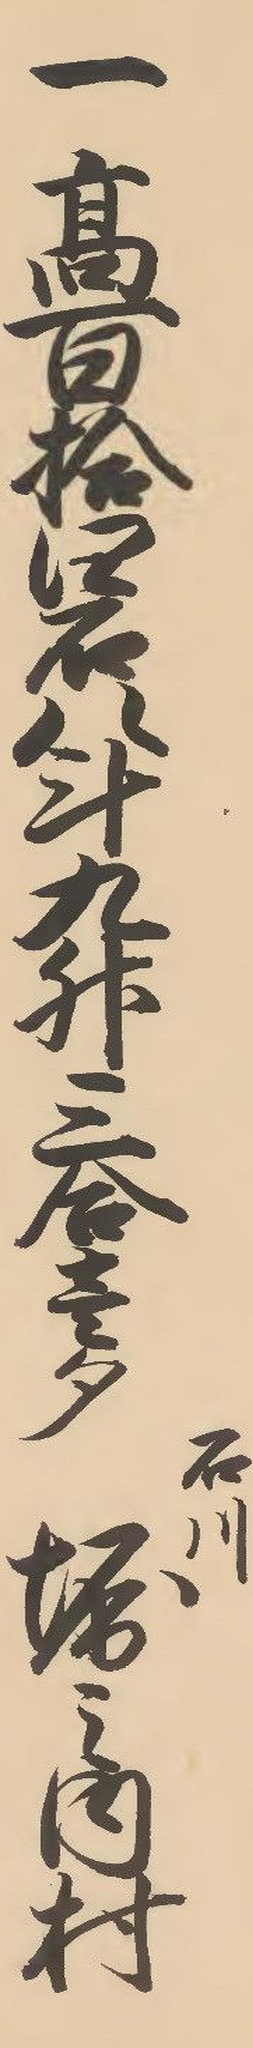一高百拾四石八斗九升三合壱勺堀之内村
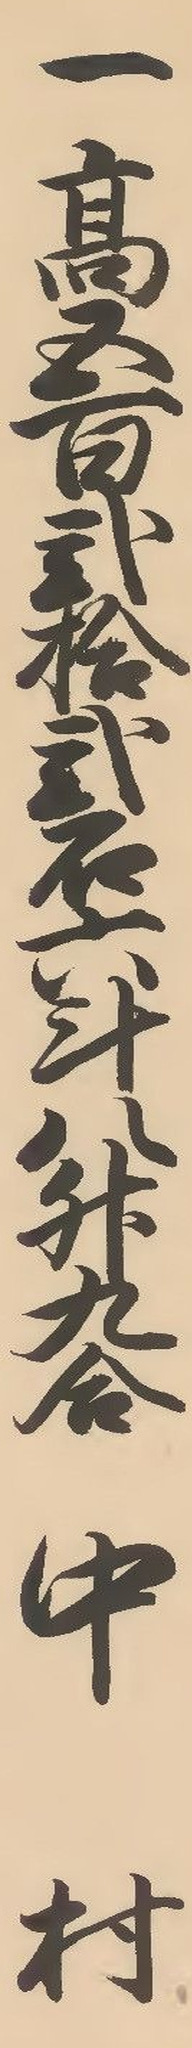一高五百弐拾弐石六斗八升九合中村
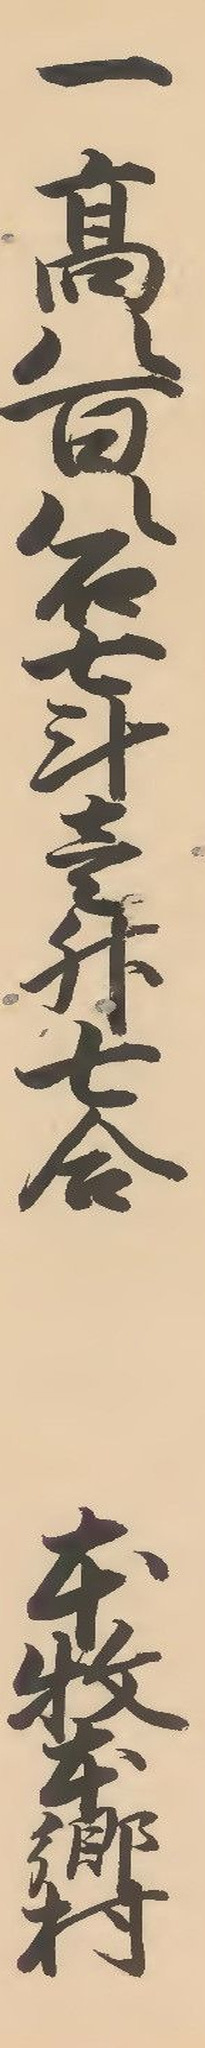一高八百八石七斗壱升七合本牧本郷村

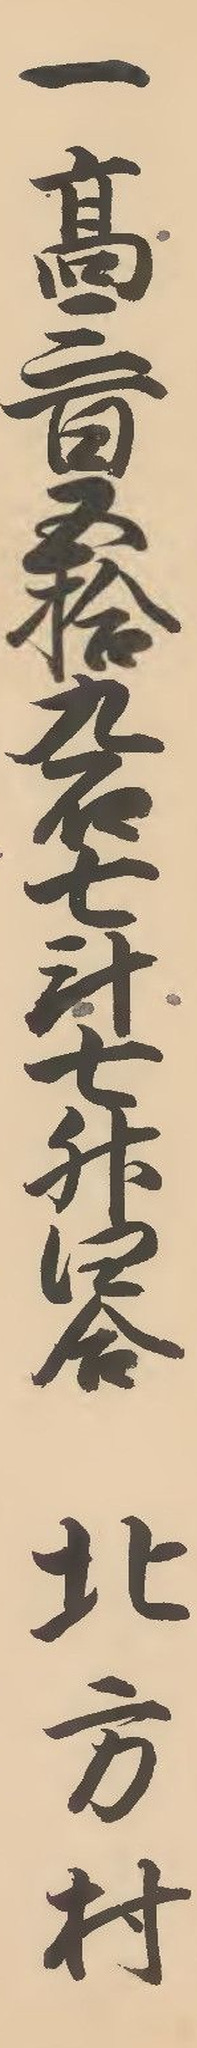一高三百五拾九石七斗七升四合北方村
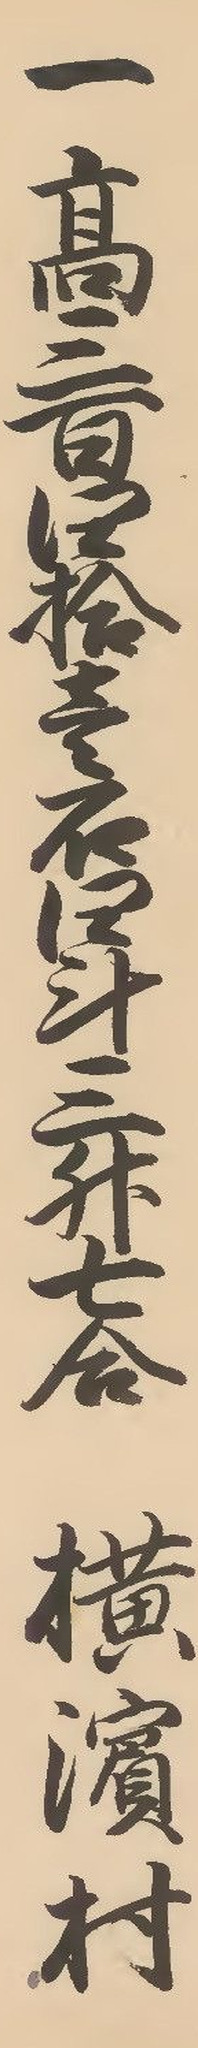一高三百四拾壱石四斗三升七合横濱村
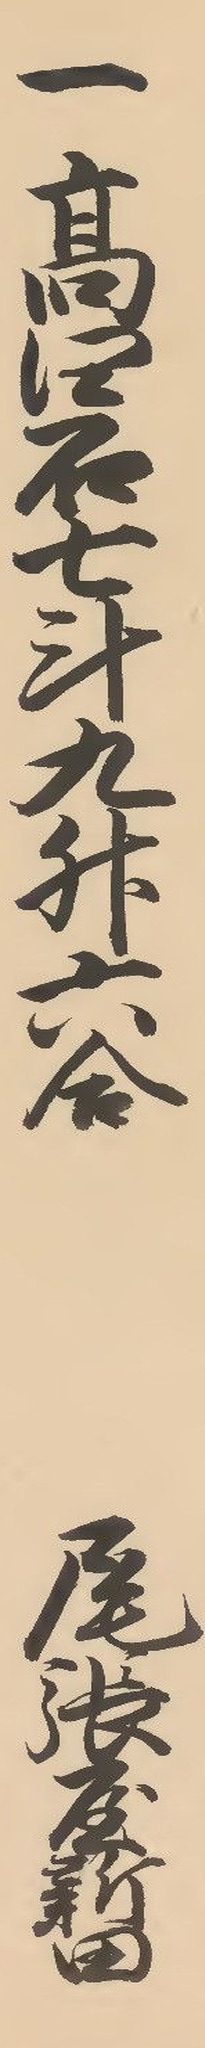一高四石七斗九升六合尾張屋新田
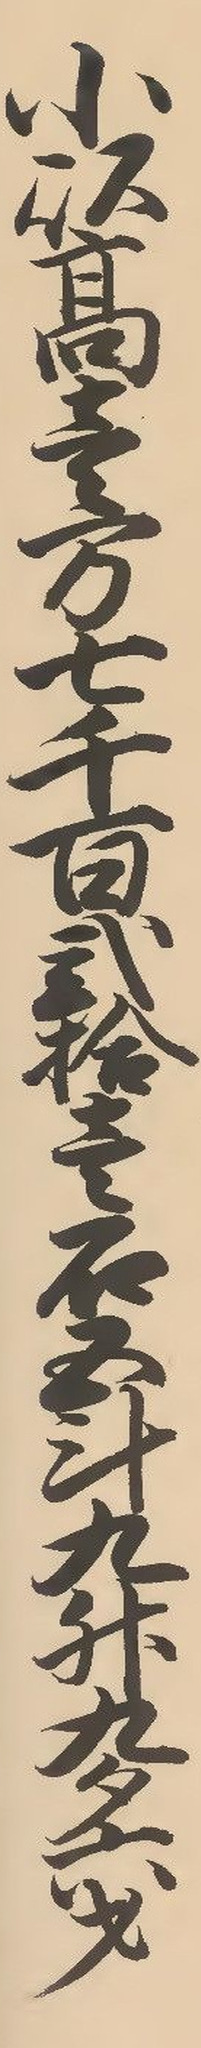小以高壱万七千百弐拾壱石五斗九升九勺六才

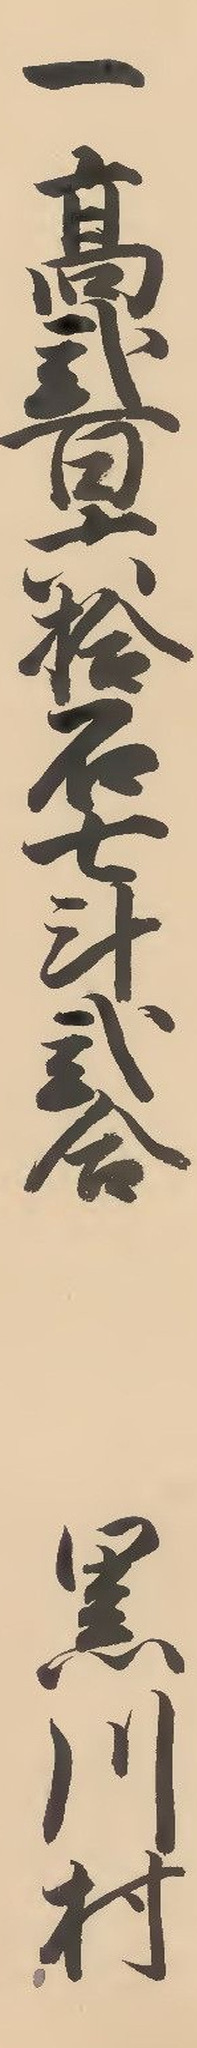一高弐百六拾石七斗弐合黒川村
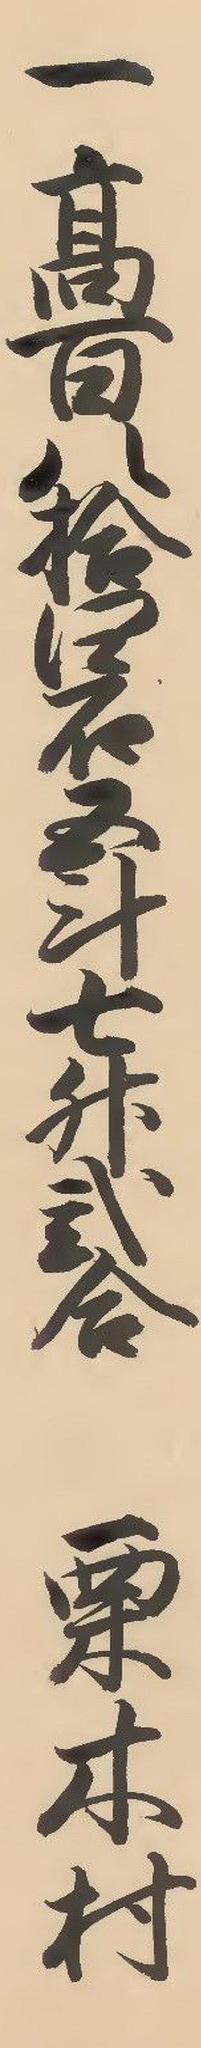一高百八拾四石五斗七升弐合栗木村
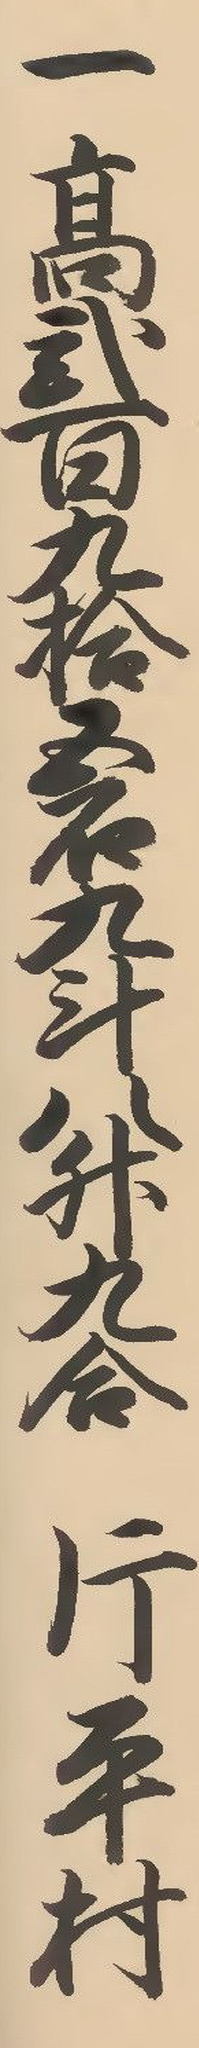一高弐百九拾五石九斗八升九合片平村
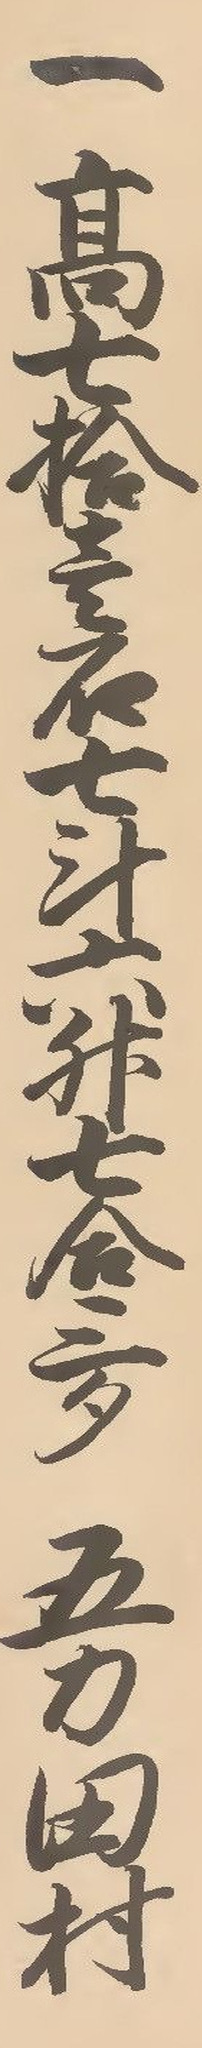一高七拾壱石七斗六升七合三勺五力田村
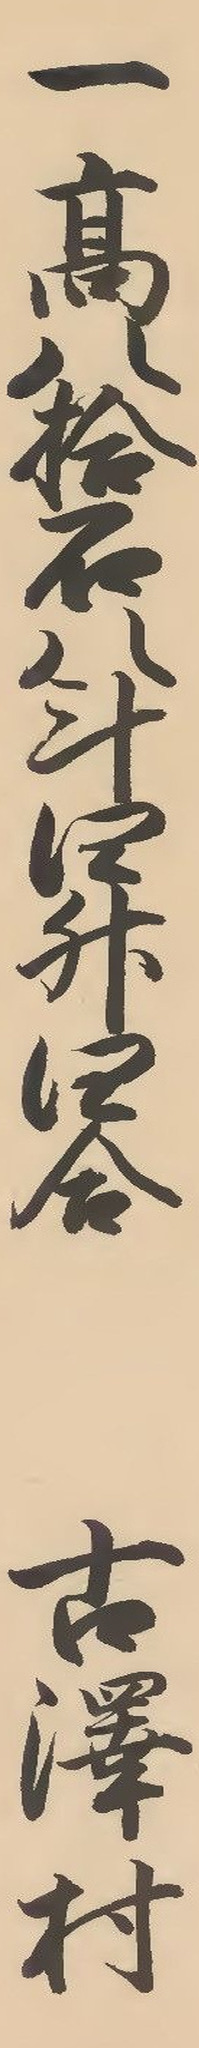一高八拾石八斗四升四合古澤村
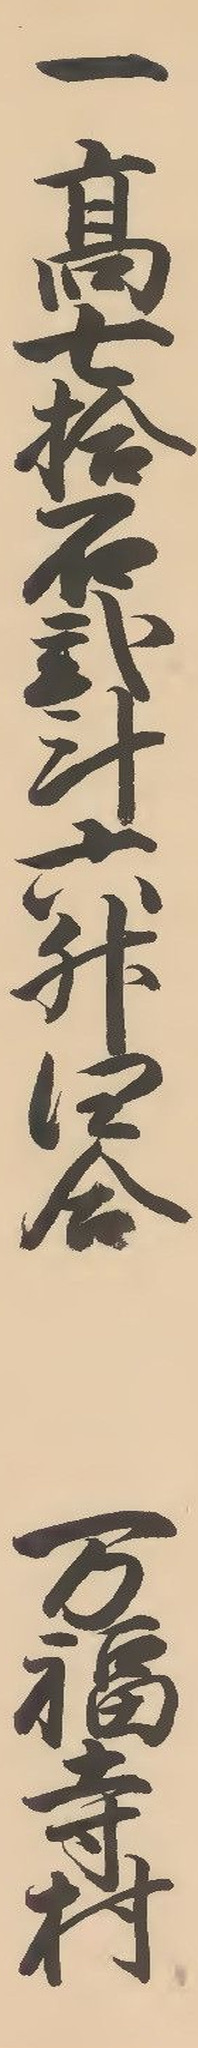一高七拾石弐斗六升四合万福寺村
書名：武蔵国郷帳　上
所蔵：国立公文書館 National Archives of Japan
